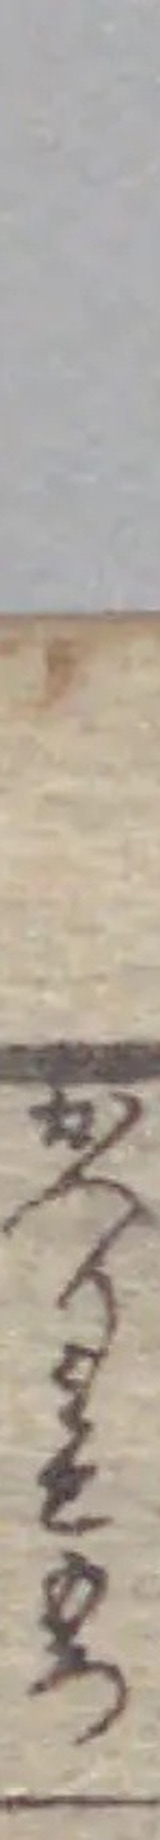かへりみこもろ
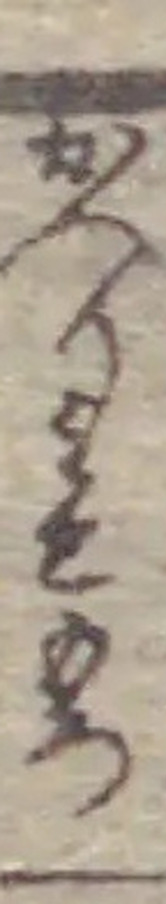かへりみこもろ
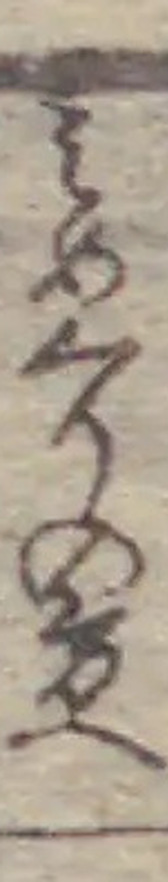みめくりの方へ
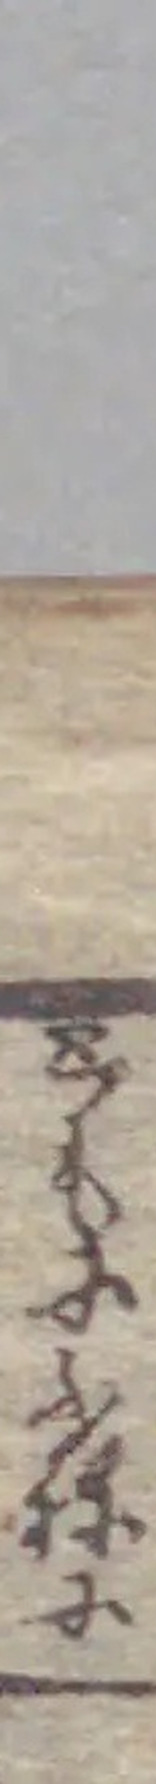ともにふねに
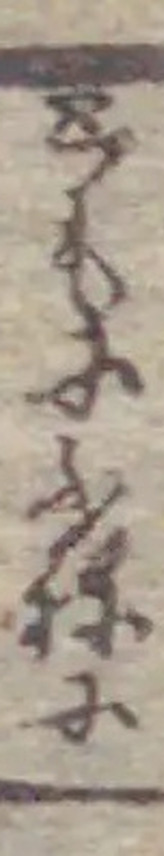ともにふねに
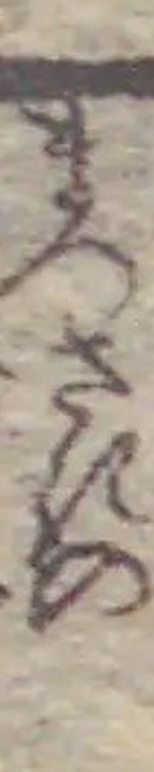まつさきの

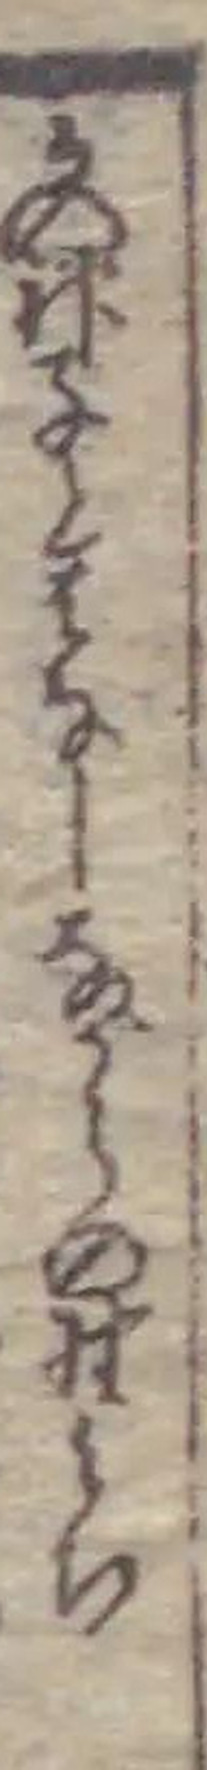又神子とはなしながらの野みち
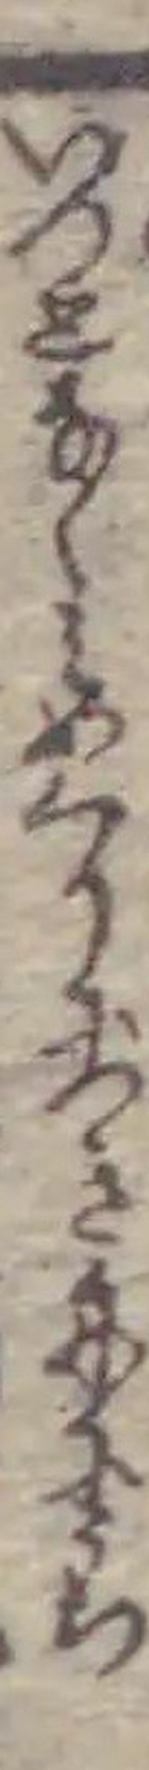いつとなくみめくりにつき舟にうち
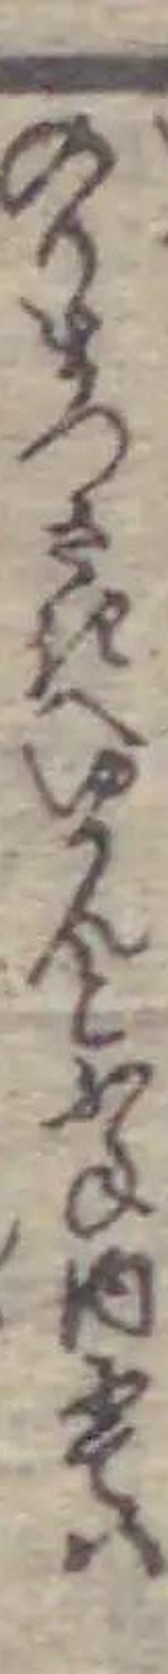のりまつさきへゆかんとふね内にては
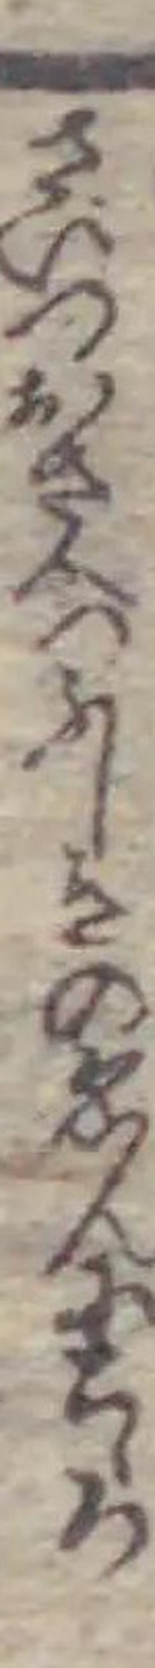さいつおさへつふしきのゑんにこゝろ
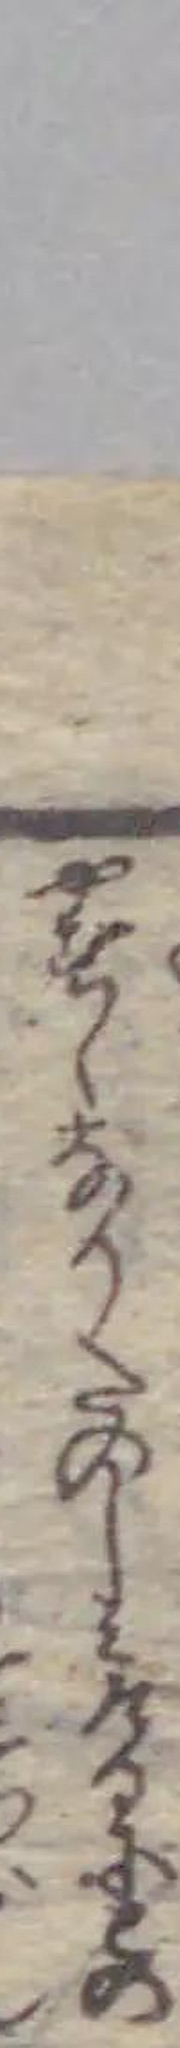やすくなりたのしみけるにこの
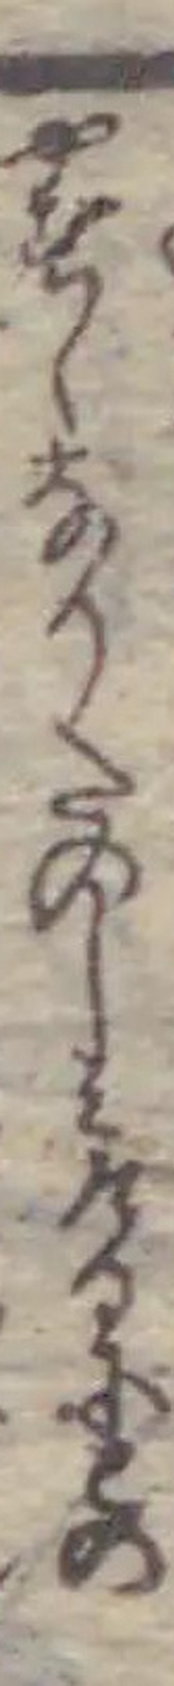やすくなりたのしみけるにこの
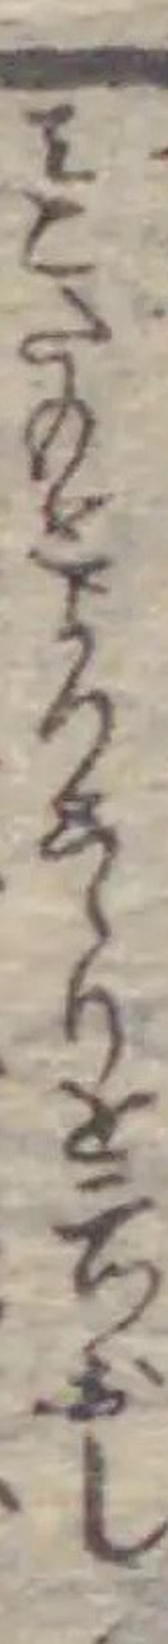みこたもとよりとくりを二ツ出し
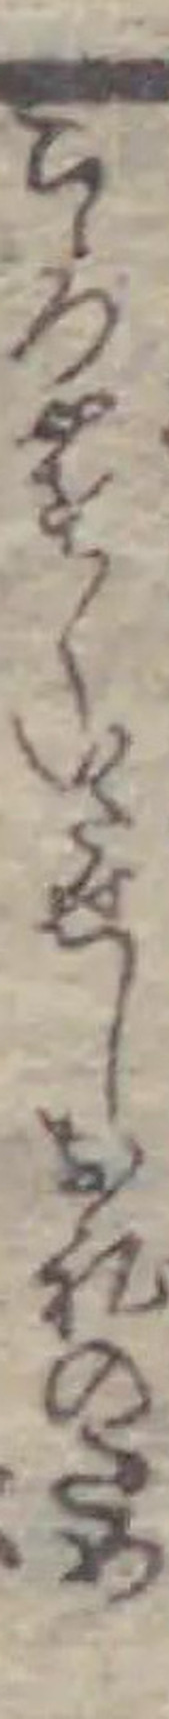こゝろやすくいたせしお礼のため
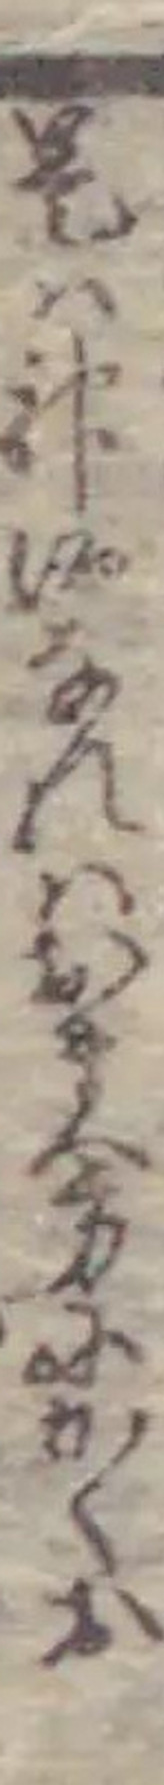是は神酒なれはおまへ方にかくお
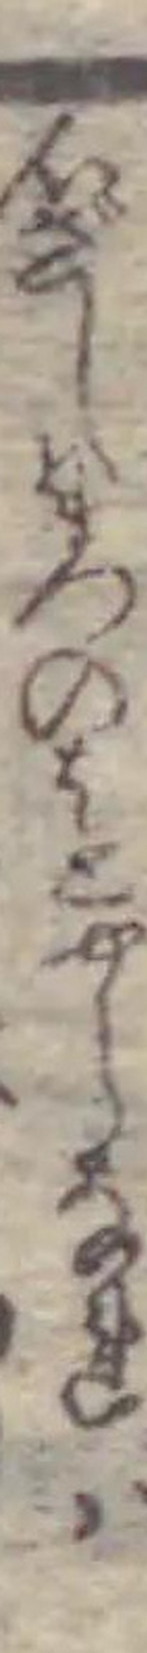心ざしはまつのはとやらなれは
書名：藝者五人娘 2巻
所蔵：国立国会図書館 National Diet Library, JAPAN
